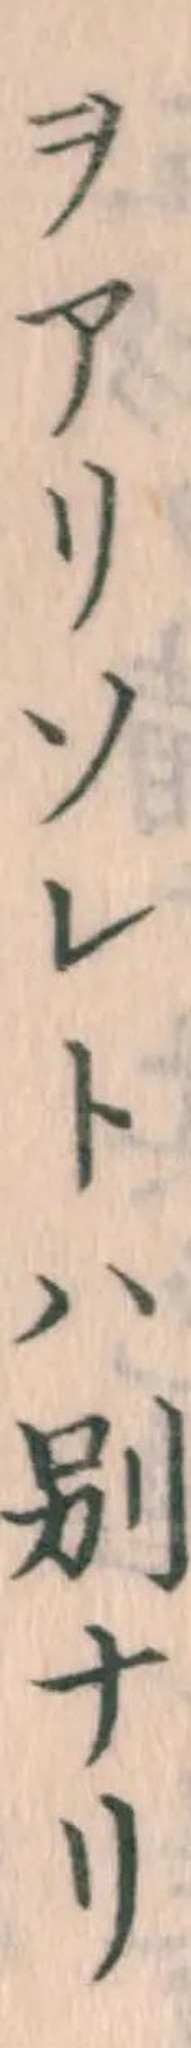ヲアリソレトハ別ナリ
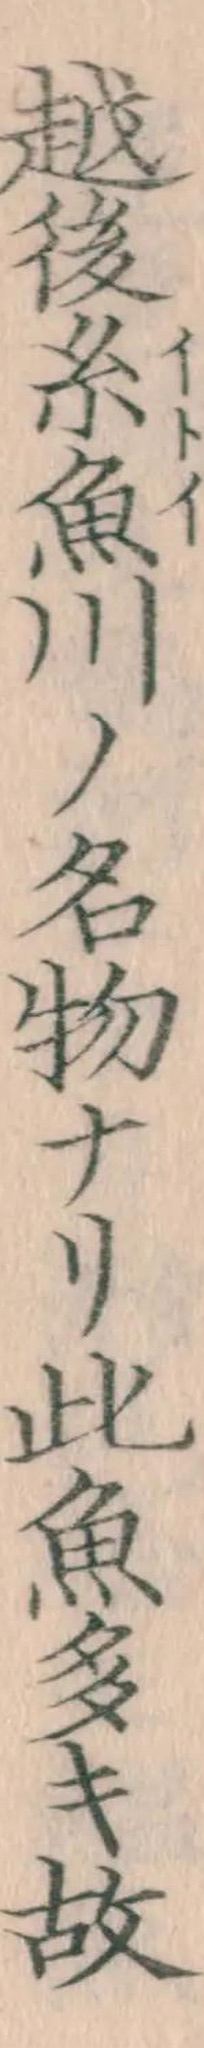越後糸魚川ノ名物ナリ此魚多キ故
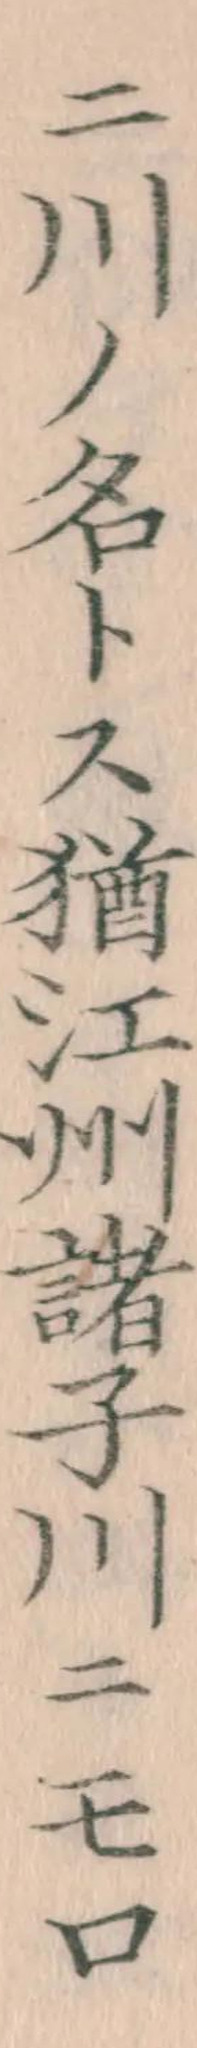ニ川ノ名トス猶江州諸子川ニモロ
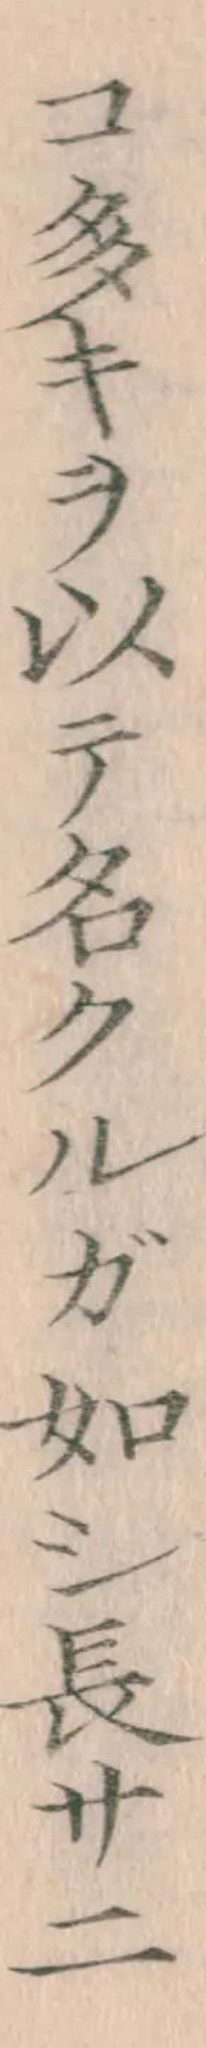コ多キヲ以テ名クルガ如シ長サ二
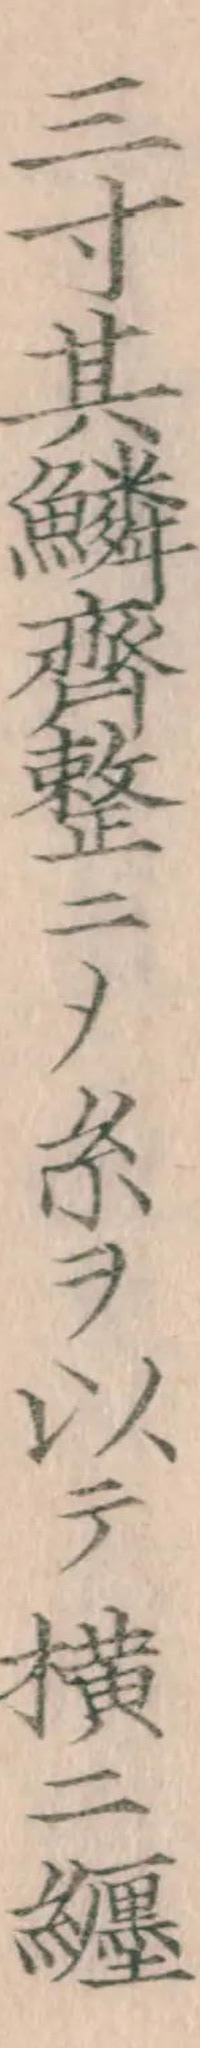三寸其鱗斉整ニシテ糸ヲ以テ横ニ纏
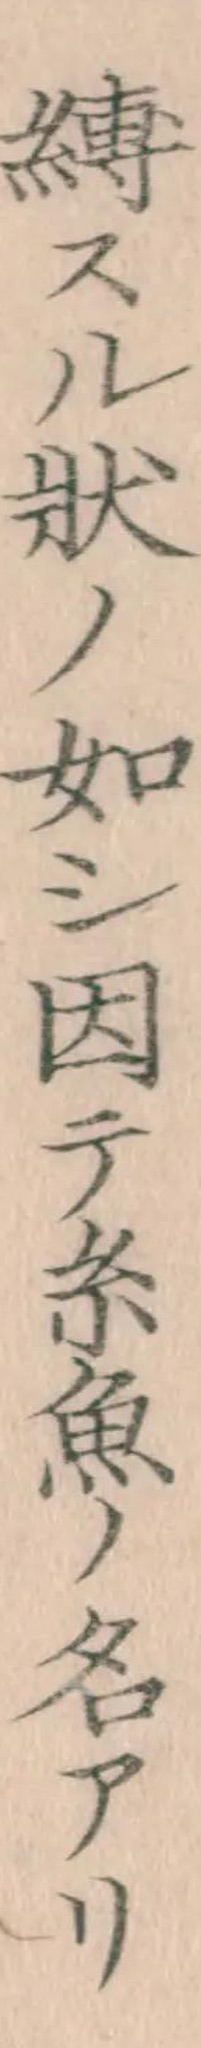縛スル状ノ如シ因テ糸魚ノ名アリ
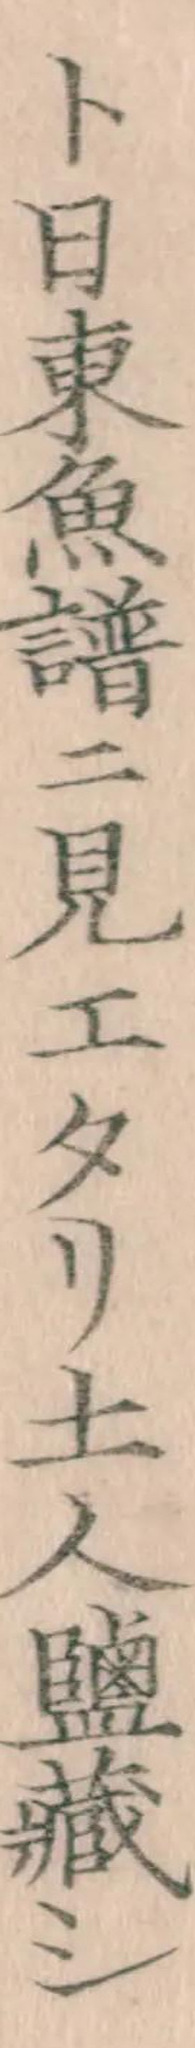ト日東魚譜ニ見エタリ土人塩蔵シ
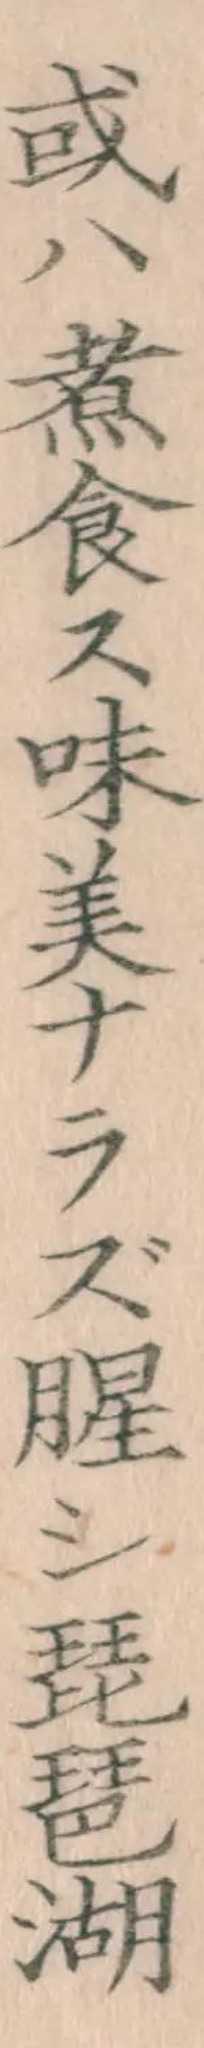或ハ煮食ス味美ナラズ腥シ琵琶湖
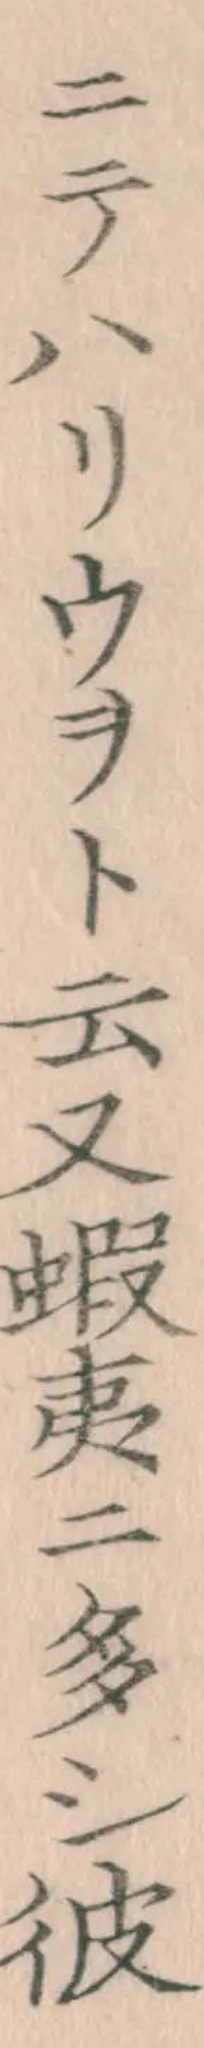ニテハリウヲト云又蝦夷ニ多シ彼
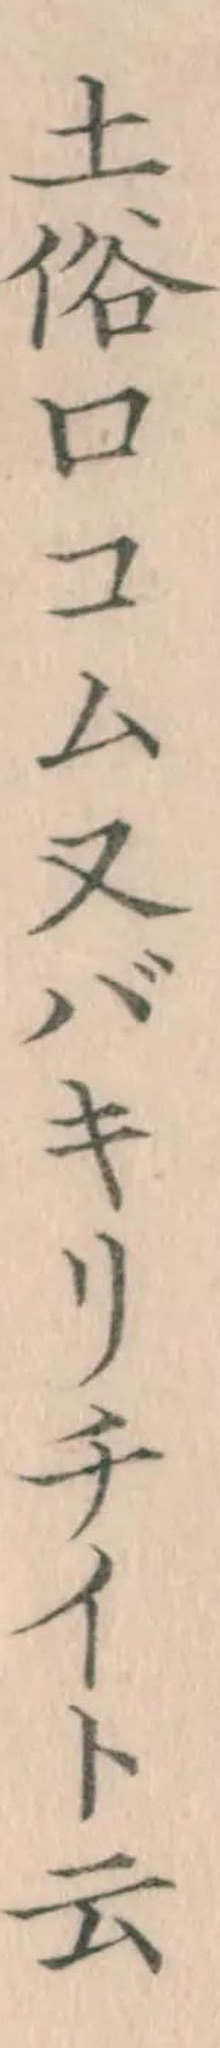土俗ロコム又バキリチイト云

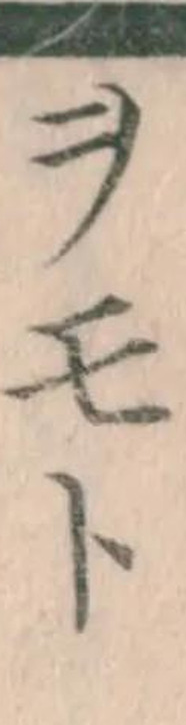ヲモト
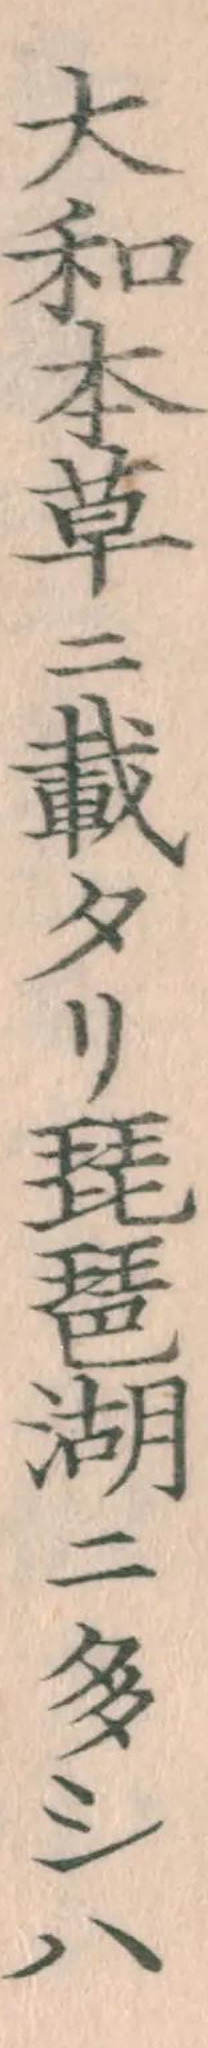大和本草ニ載タリ琵琶湖ニ多シハ
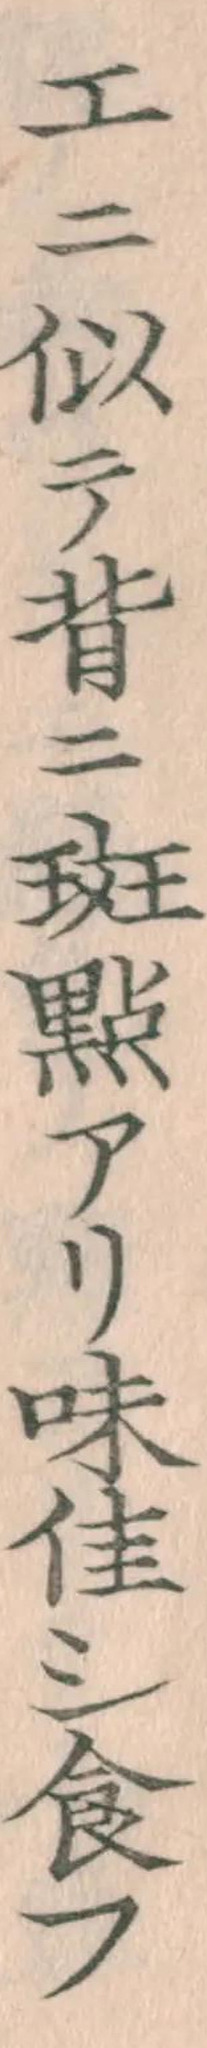エニ似テ背ニ斑点アリ味佳シ食フ
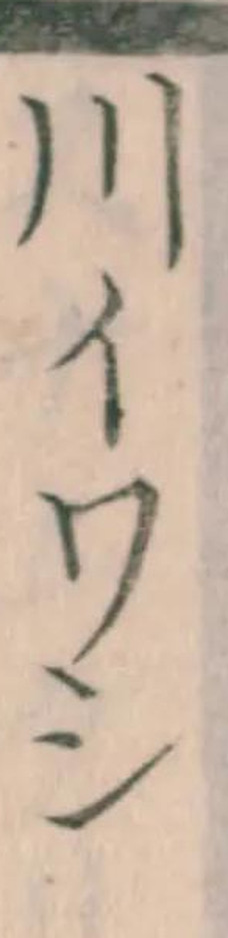川イワシ
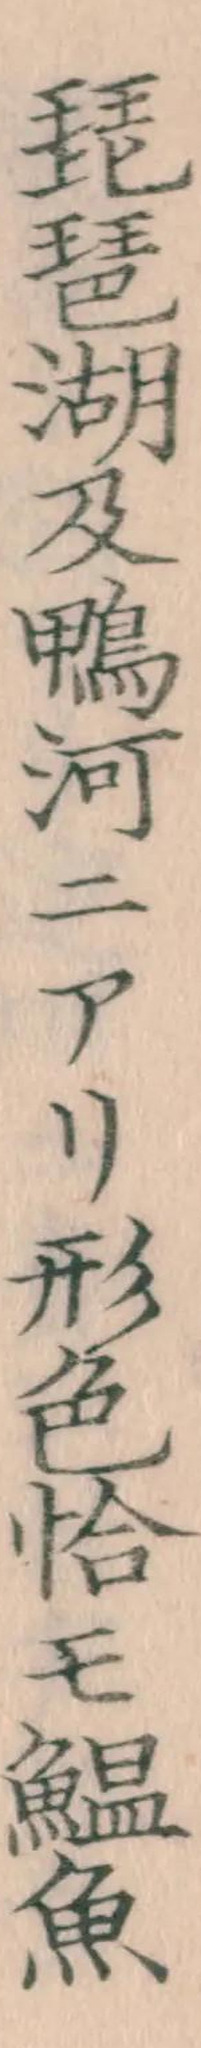琵琶湖及鴨河ニアリ形色恰モ鰛魚
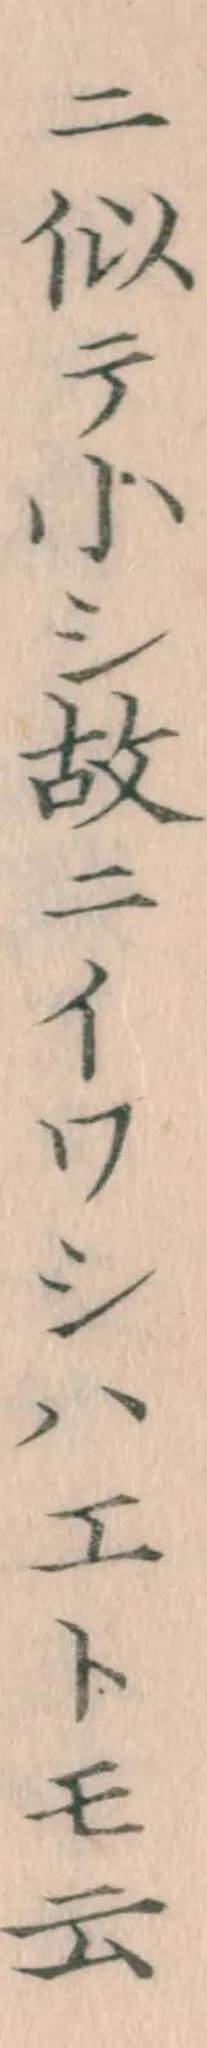ニ似テ小シ故ニイワシハエトモ云
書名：皇和魚譜 2巻
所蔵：国立国会図書館 National Diet Library, JAPAN
